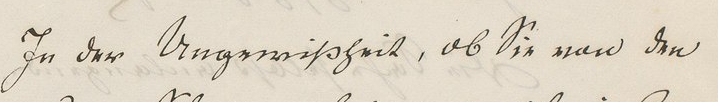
In der Ungewißheit, ob Sie von den
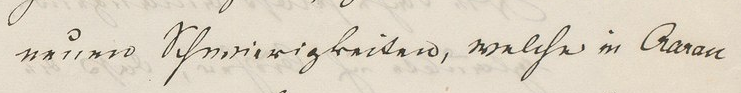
neuen Schwierigkeiten, welche in Aarau
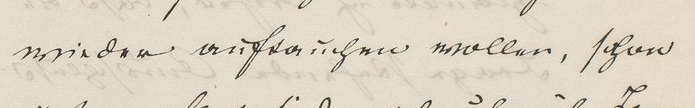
wieder auftauchen wollen, schon
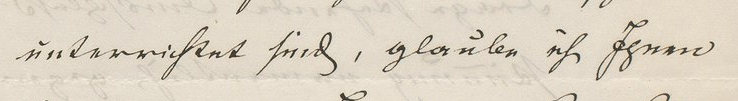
unterrichtet sind, glaube ich Ihnen
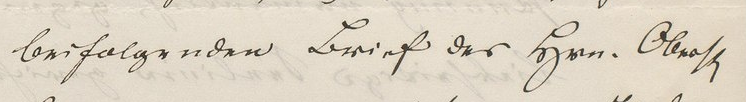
beifolgenden Brief des Hrn. Oberst
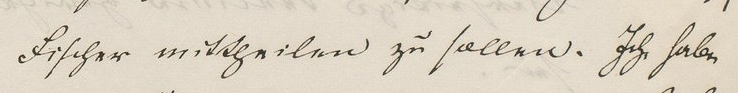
Fischer mittheilen zu sollen. Ich habe
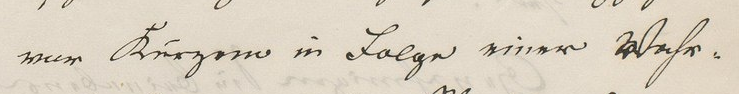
vor Kurzem in Folge einer Wahr-
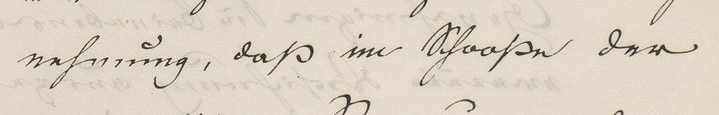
nehmung, daß im Schooße der
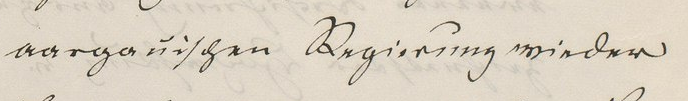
aargauischen Regierung wieder
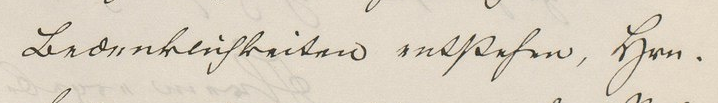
Bedenklichkeiten entstehen, Hrn.
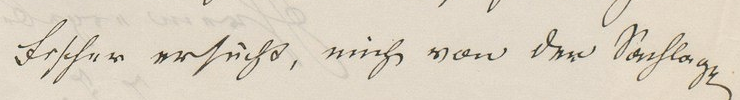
Fischer ersucht, mich von der Sachlage
